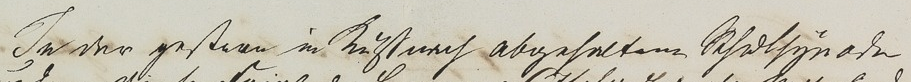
In der gestern in Küßnach abgehaltenen Schulsynode
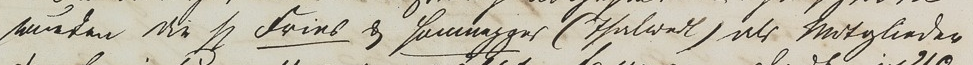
wurden die Herren Fries & Honegger (Thalweil) als Mitglieder
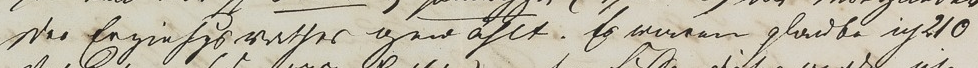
des Erziehungsrathes gewählt. Es waren glaube ich 210
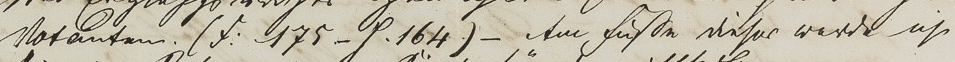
Votanten. (F: 175 – H. 164.) ­ Am Fuße dieses werde ich
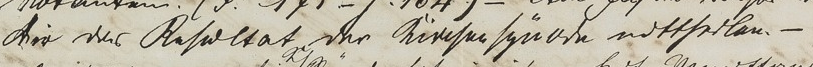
Dir das Resultat der Kirchensynode mittheilen. ­
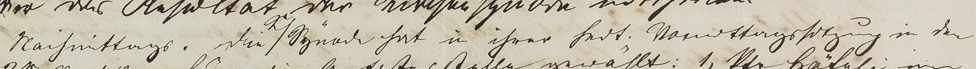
Nachmittags. Die KSynode hat in ihrer heut. Vormittagssitzung in den
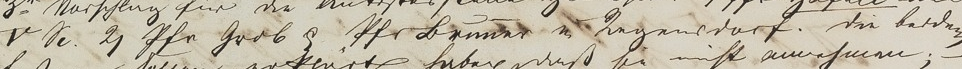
V.Sc. 2) Pfr Grob & Pfr Brunner v Regensdorf. Die beiden
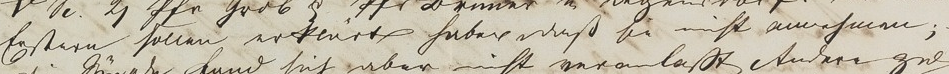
Erstern sollen erklärt haben, daß sie nicht annehmen; ­
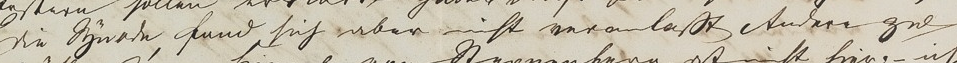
die Synode fand sich aber nicht veranlaßt, Andere zu
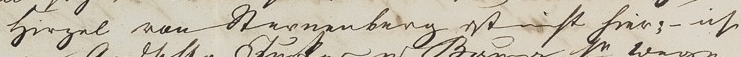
­ Hirzel von Sternenberg ist nicht hier; – ich
